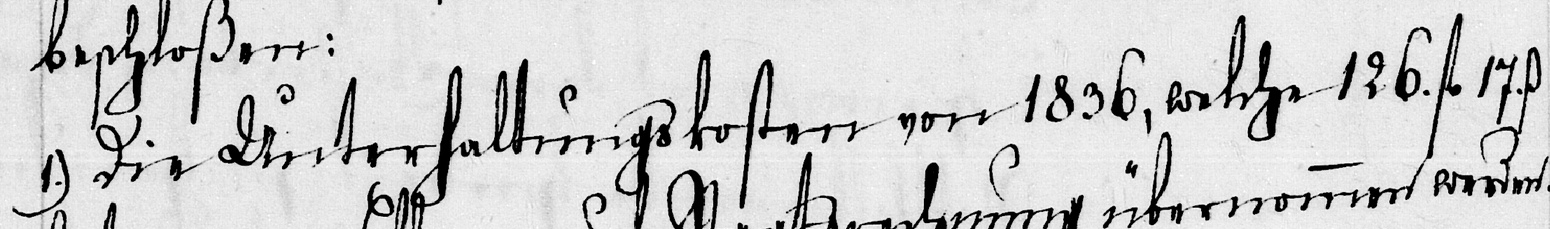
1.) Die Unterhaltungskosten von 1836, welche 126. fl.
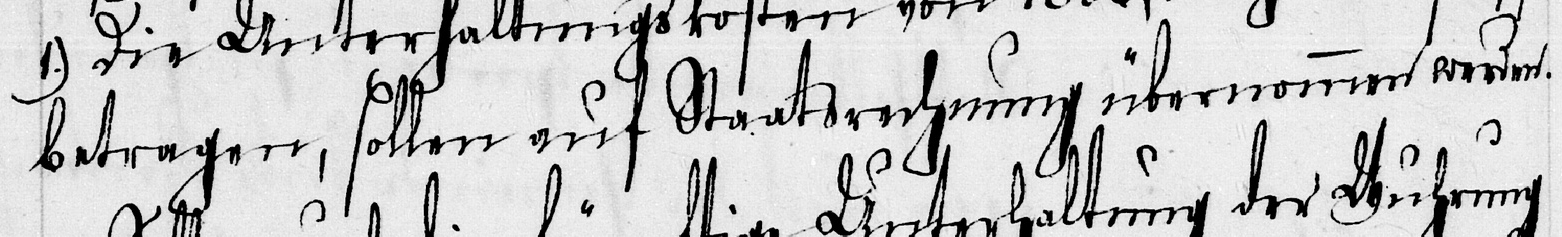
betragen, sollen auf Staatsrechnung übernommen werden.
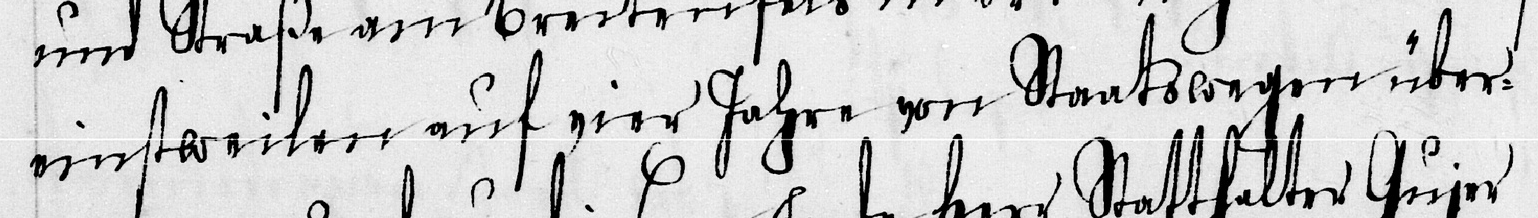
einstweilen auf vier Jahre von Staatswegen über¬
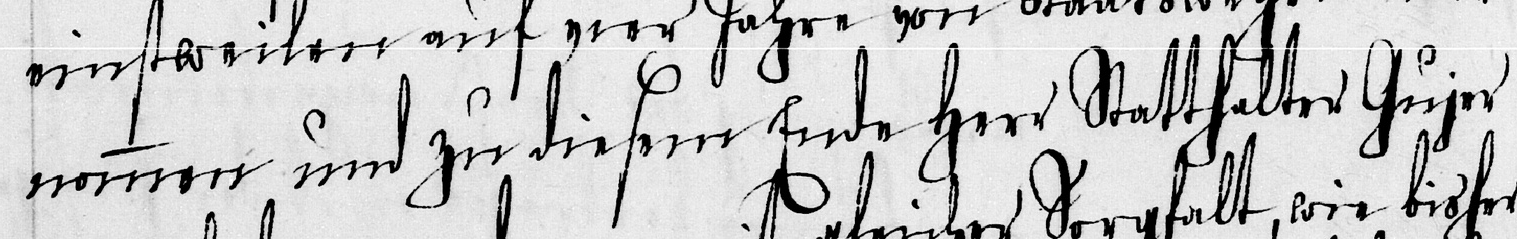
nommen und zu diesem Ende Herr Statthalter Gujer
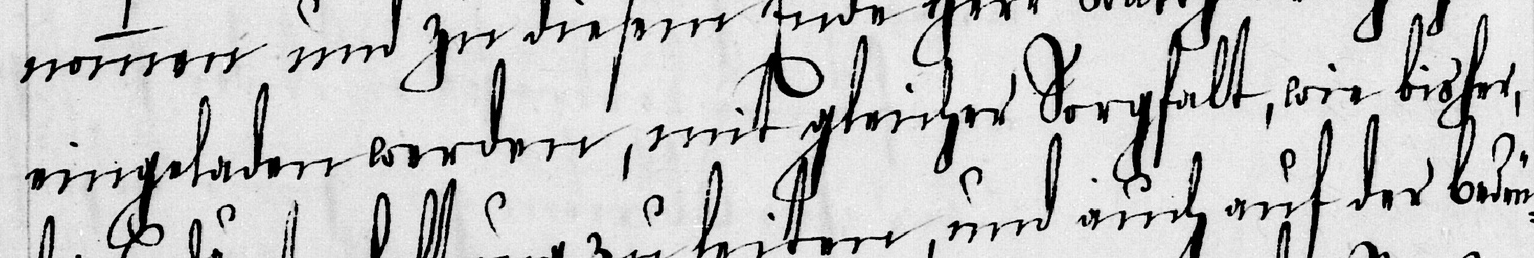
eingeladen werden, mit gleicher Sorgfalt, wie bisher,
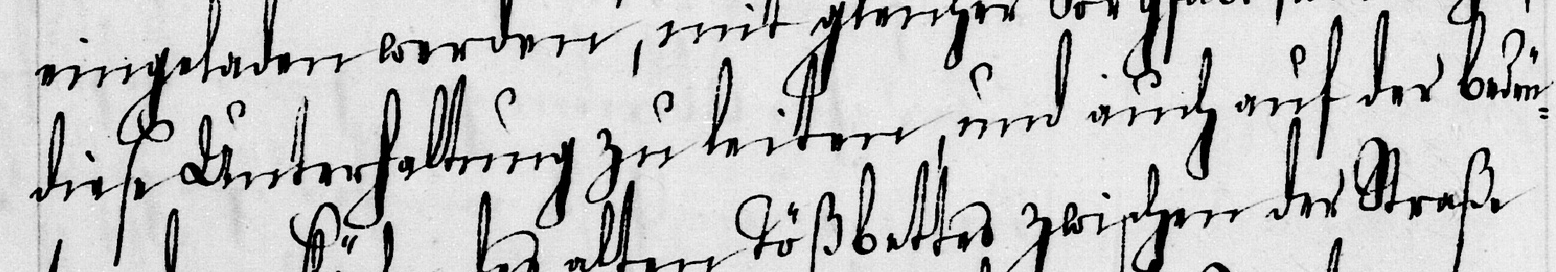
diese Unterhaltung zu leiten, und auch auf der bed¬
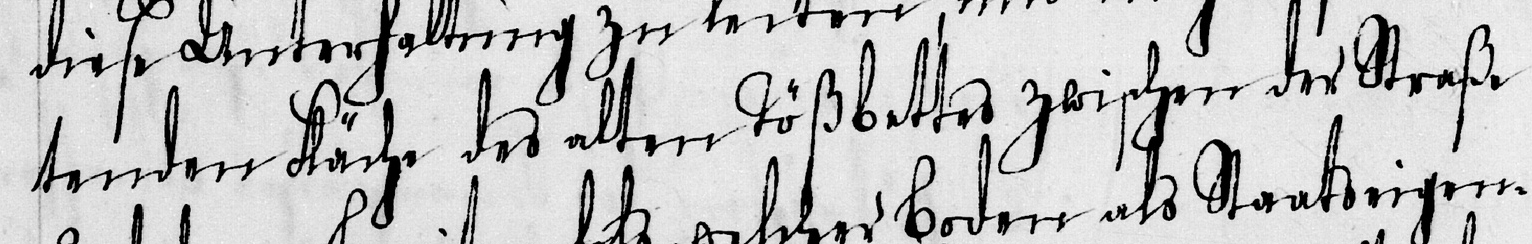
tenden Fläche des alten Tößbettes zwischen der Straße
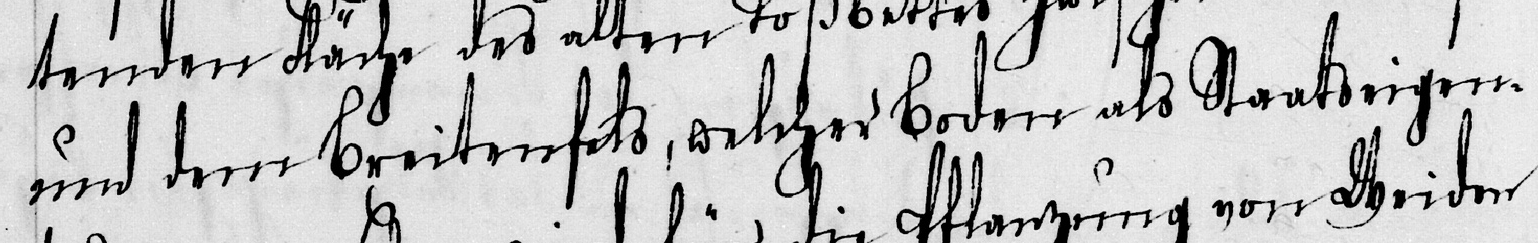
und dem Breitenfels, welcher Boden als Staatseigen¬
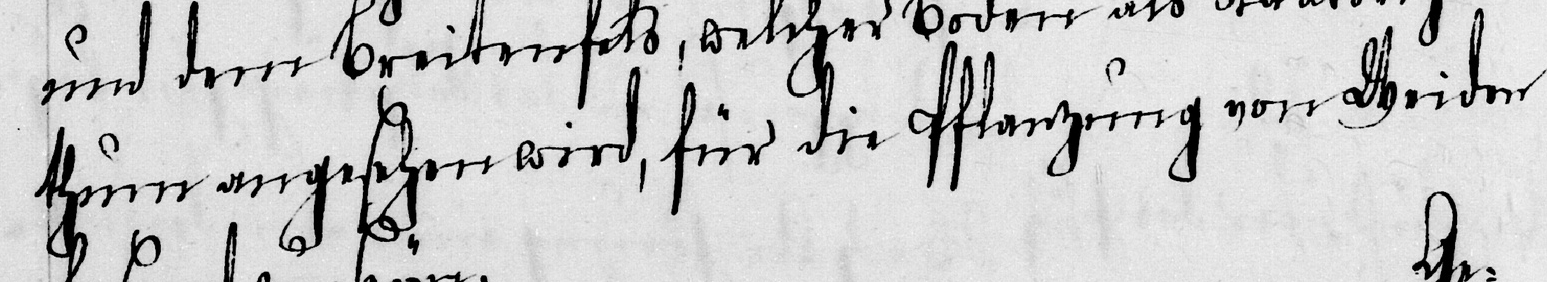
thum angesehen wird, für die Pflanzung von Weiden
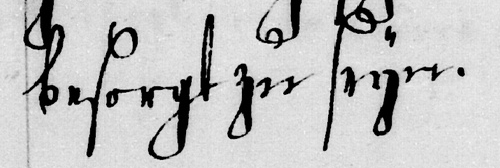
besorgt zu seyn.
